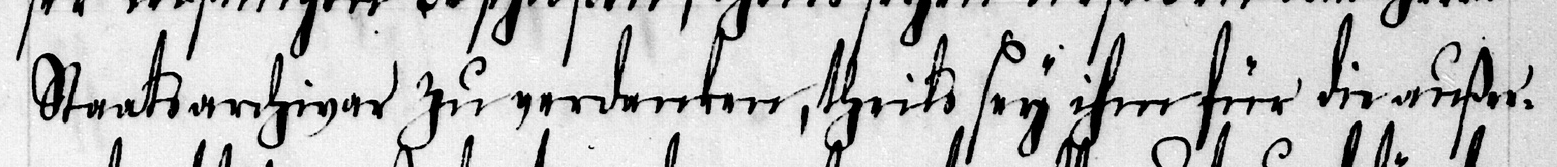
Staatsarchivar zu verdanken, theils sey ihm für die außer¬
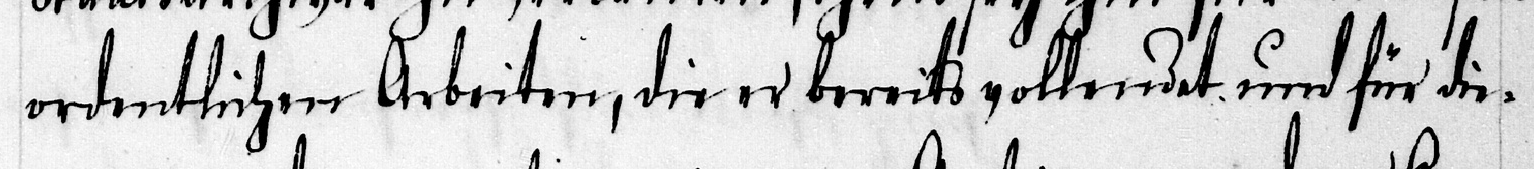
ordentlichen Arbeiten, die er bereits vollendet und für die¬
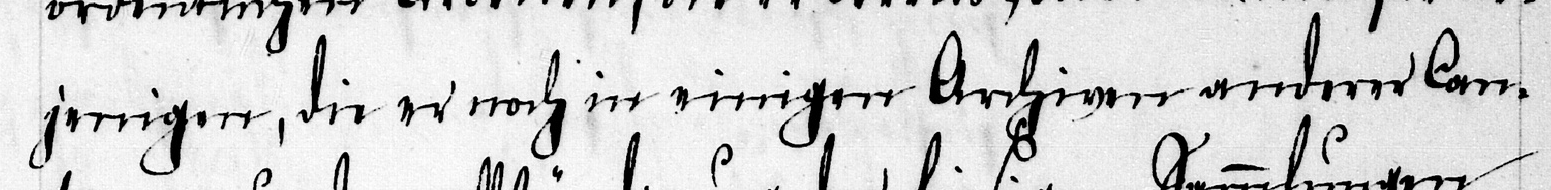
jenigen, die er noch in einigen Archiven anderer Can¬
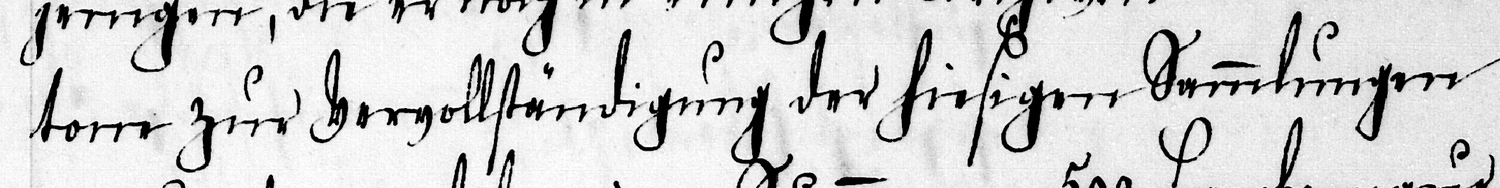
tone zur Vervollständigung der hiesigen Sammlungen
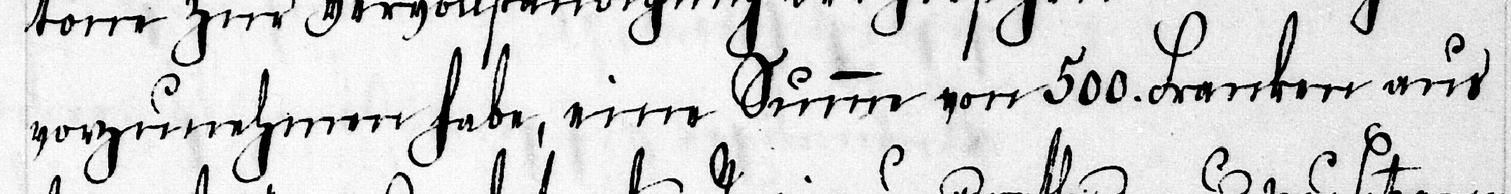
vorzunehmen habe, eine Summe von 500. Franken aus
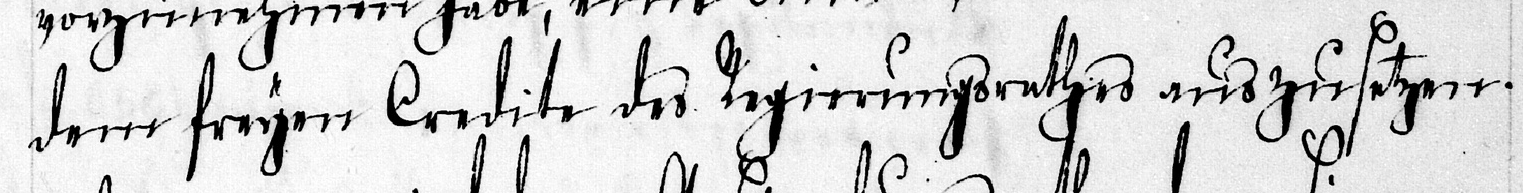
dem freyen Credite des Regierungsrathes auszusetzen.
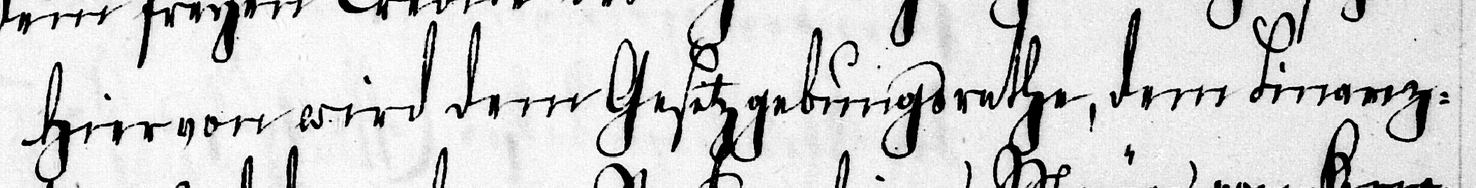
Hiervon wird dem Gesetzgebungsrathe, dem Finanz¬
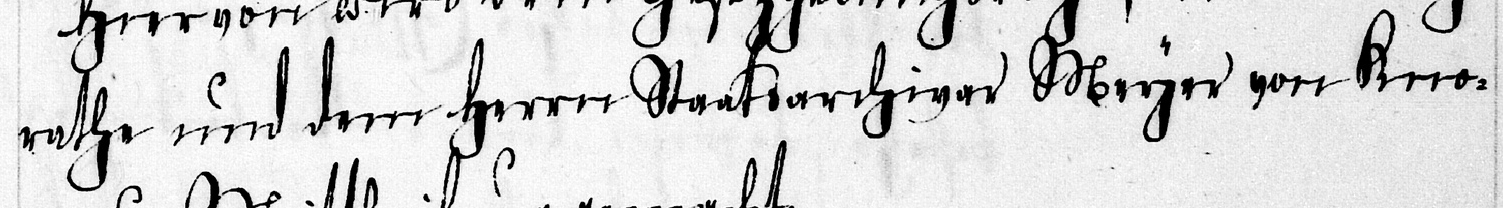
rathe und dem Herrn Staatsarchivar Meyer von Kno¬
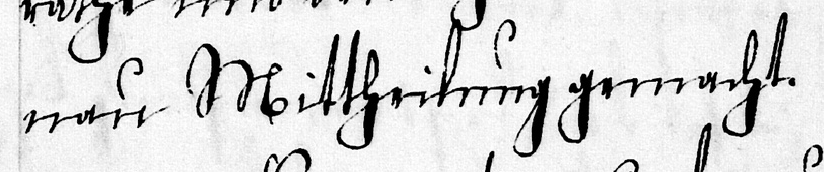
nau Mittheilung gemacht.
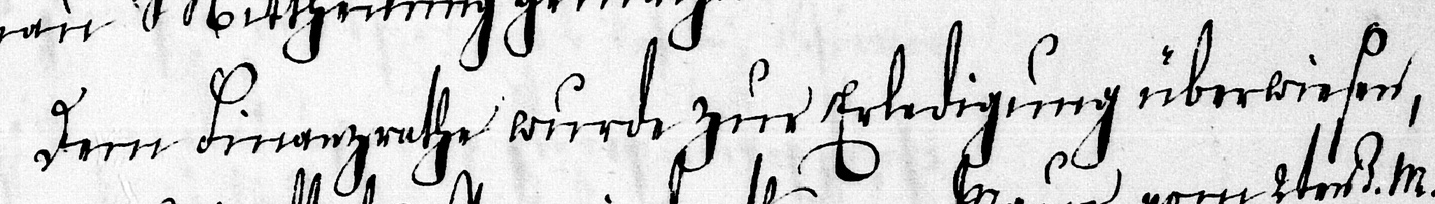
Dem Finanzrathe wurde zur Erledigung überwiesen,
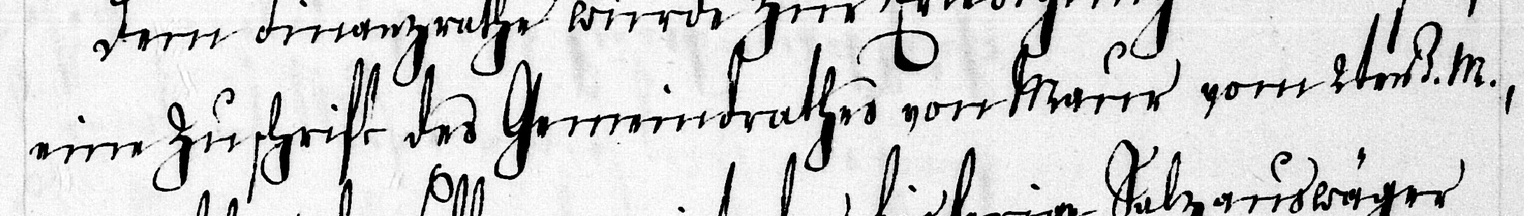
eine Zuschrift des Gemeindrathes von Maur vom 2ten d. M.,
